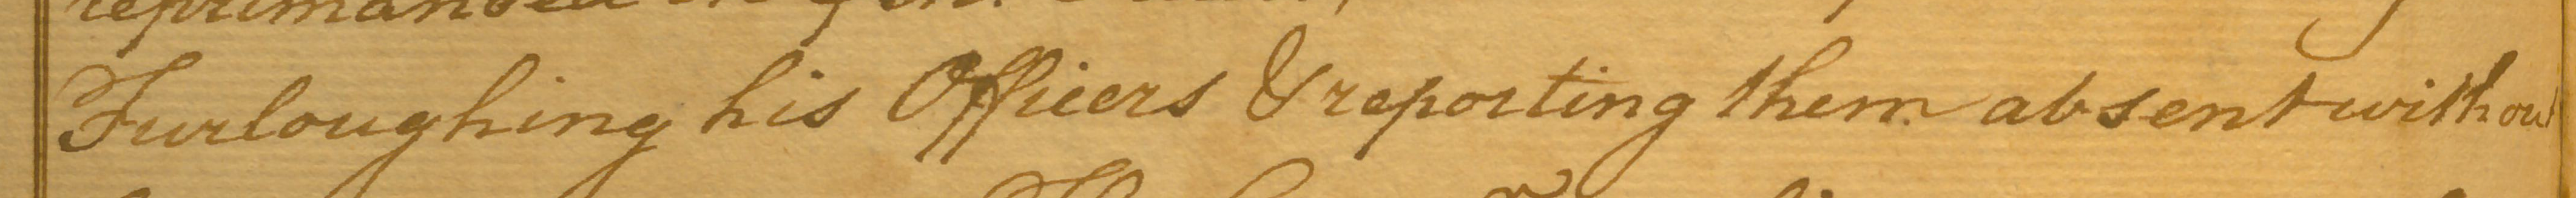Furloughing his Officers & reporting them absent without
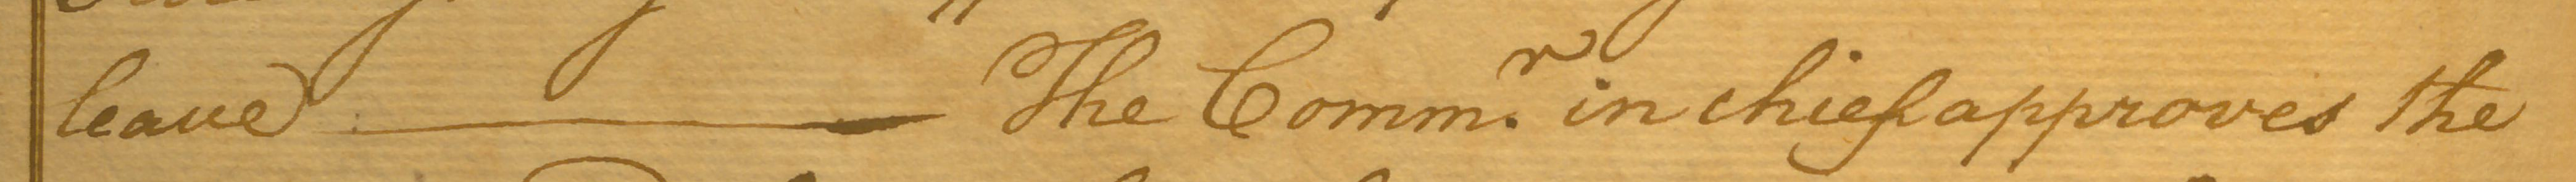leave- The Comm^r. in chief approves the
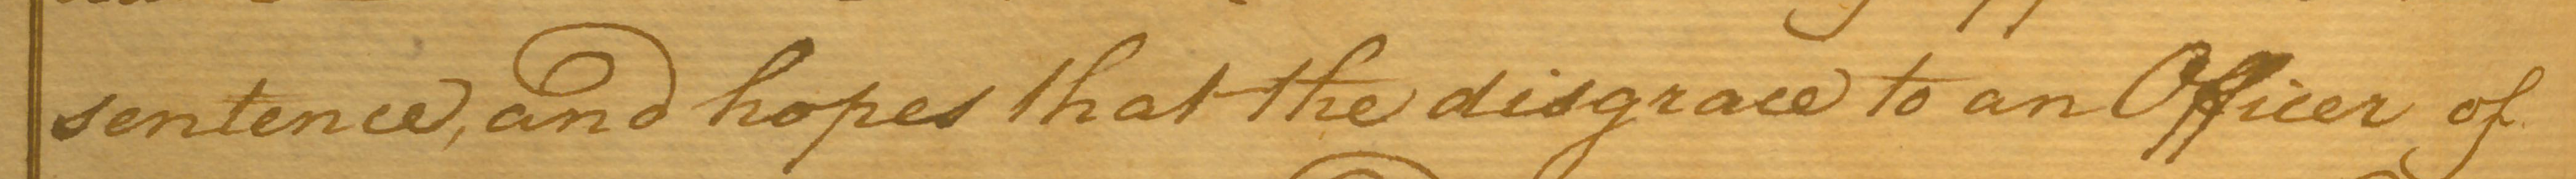sentence, and hopes that the disgrace to an Officer of
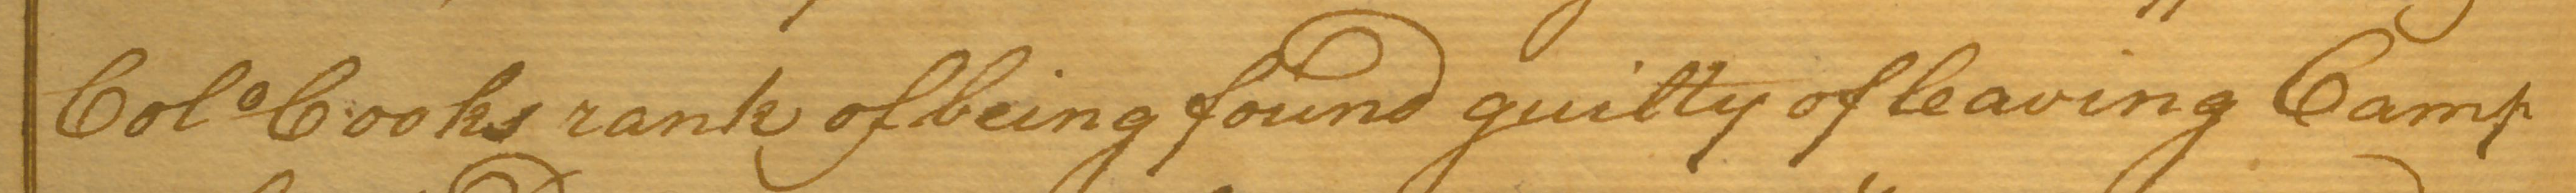Col^o Cooks rank of being found guilty of leaving Camp
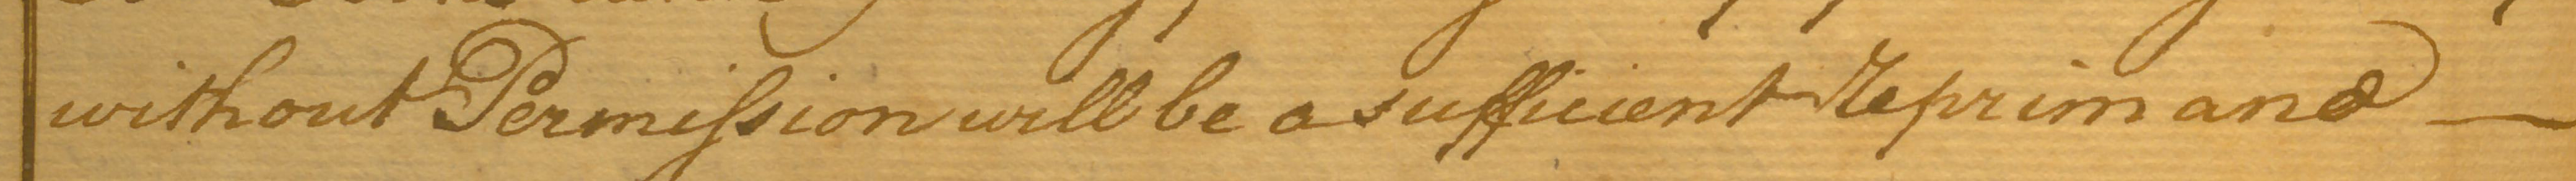without Permission will be a sufficient reprimand-
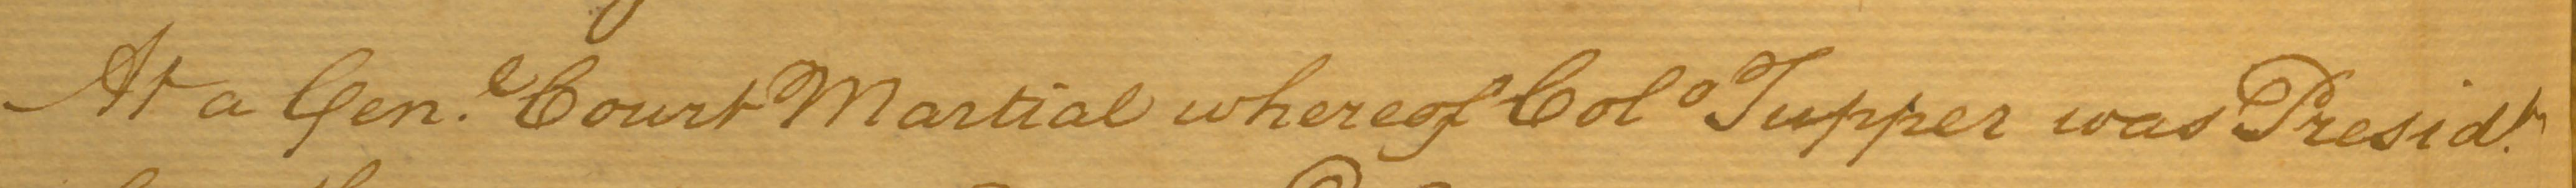At a Gen^l. Court Martial whereof Col^o Tupper was Presid^t.
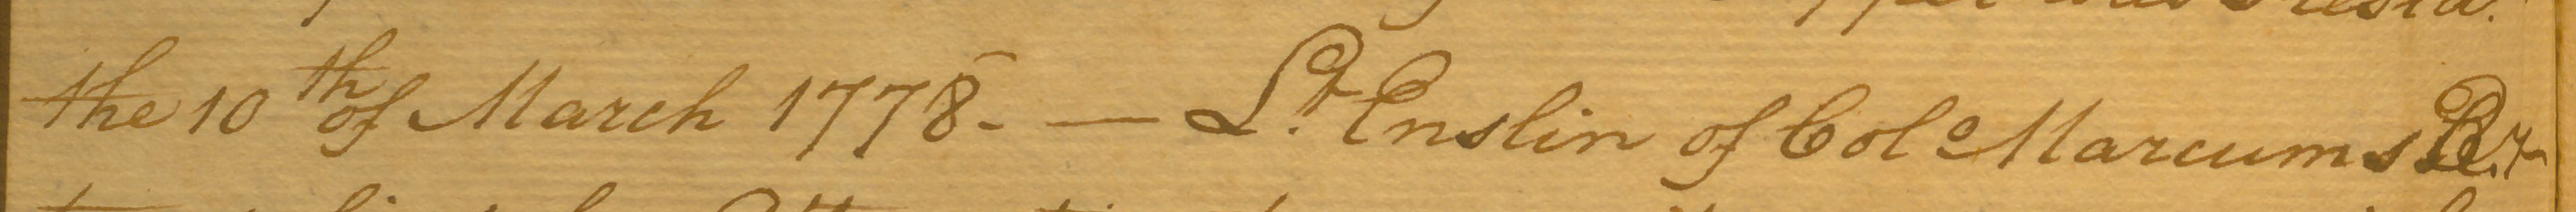the 10^th of March 1778. - L^t. Enslin of Col^o Marcums C^y.
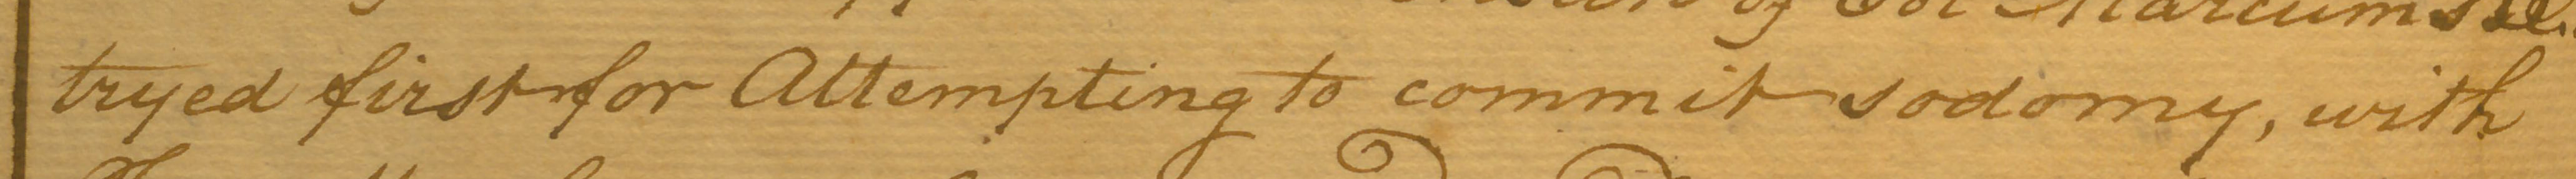tryed first for Attempting to commit sodomy, with
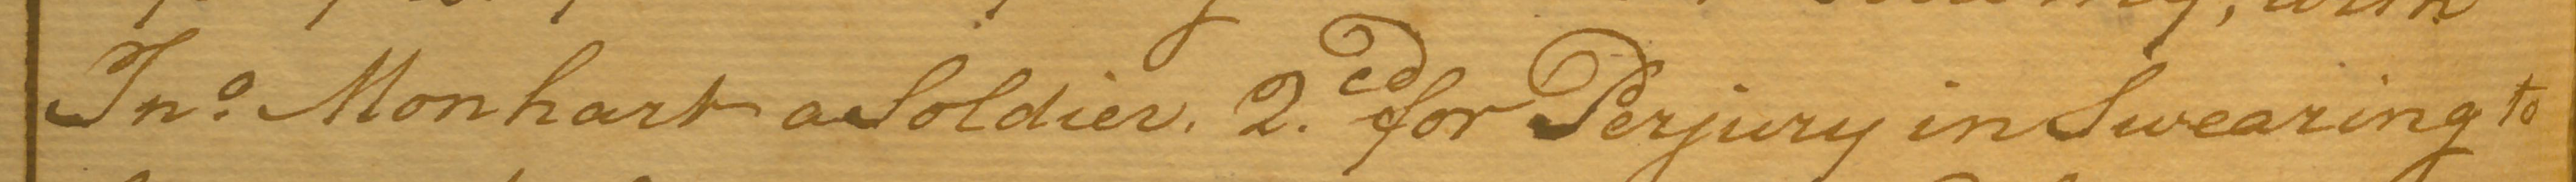Jn^o. Monhart a Soldier 2^nd for Perjury in Swearing to
